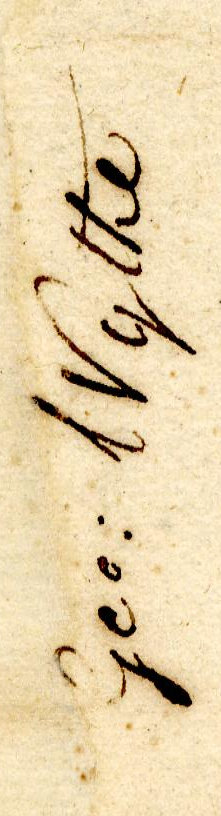Geo: Wythe
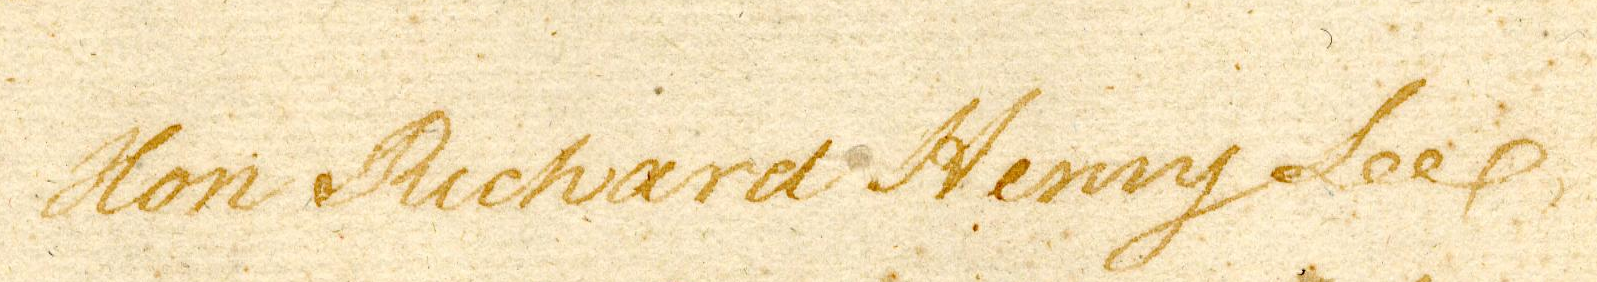Hon Richard Henry Lee
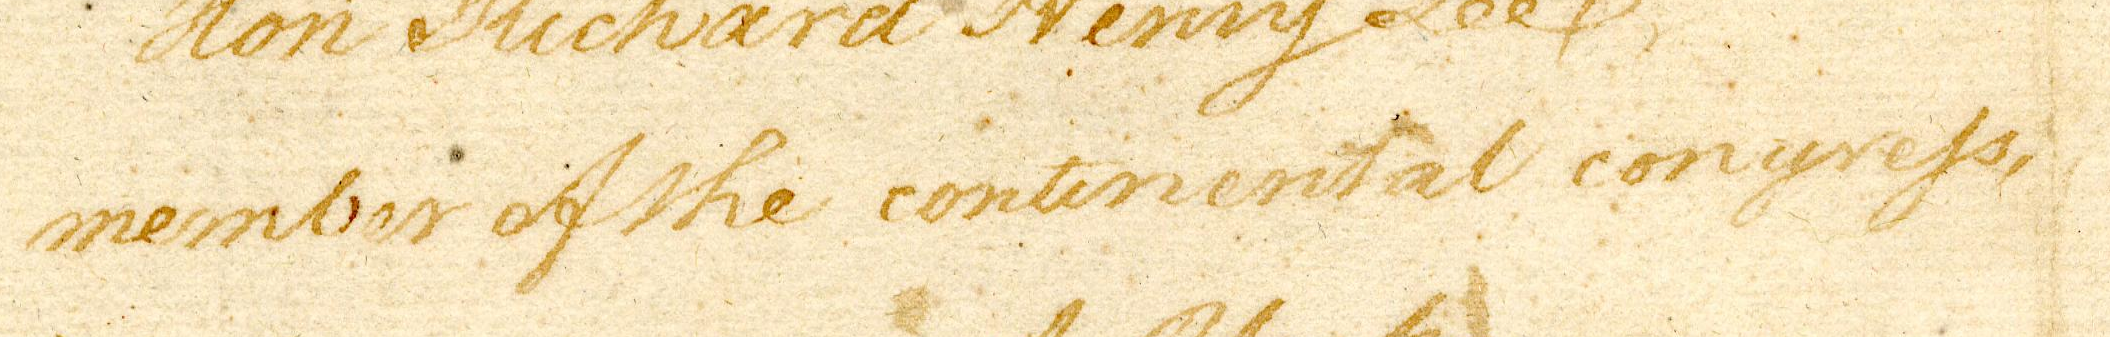member of the continental congress
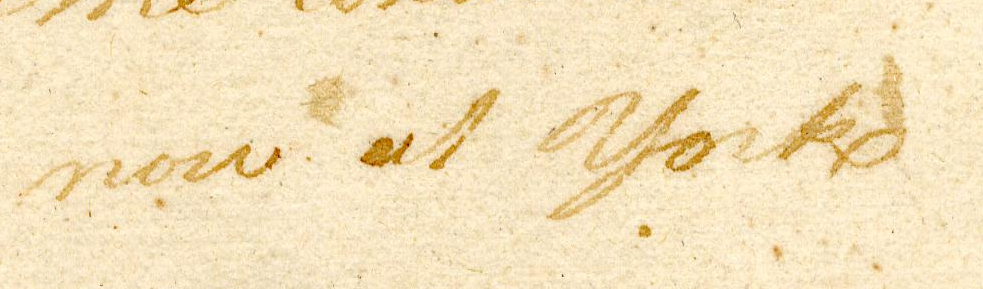now at York
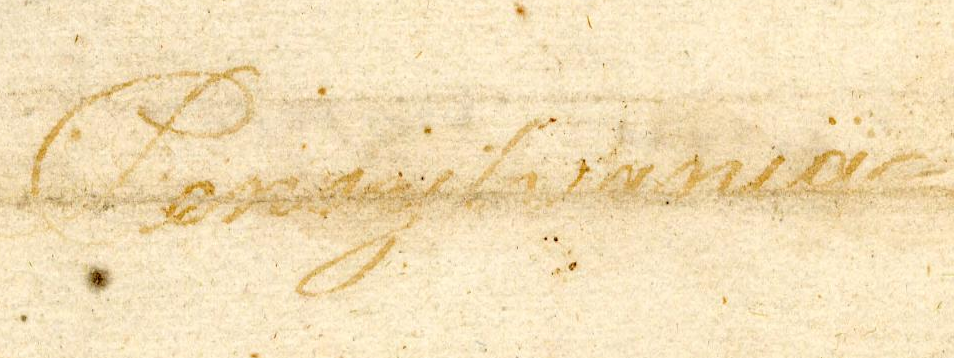Pennsylvania
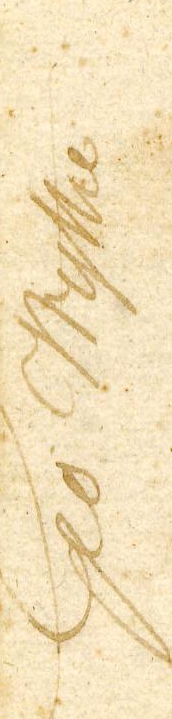Geo Wythe
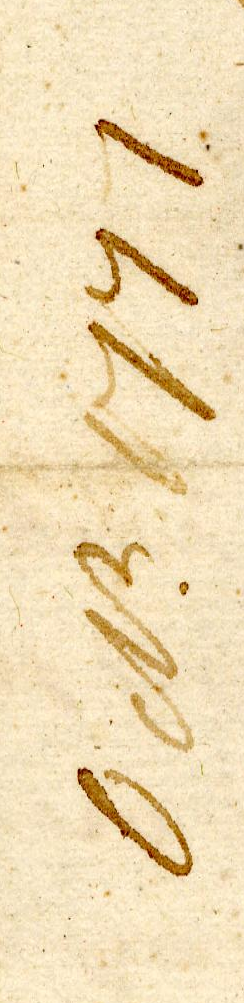Oct^r. 1777
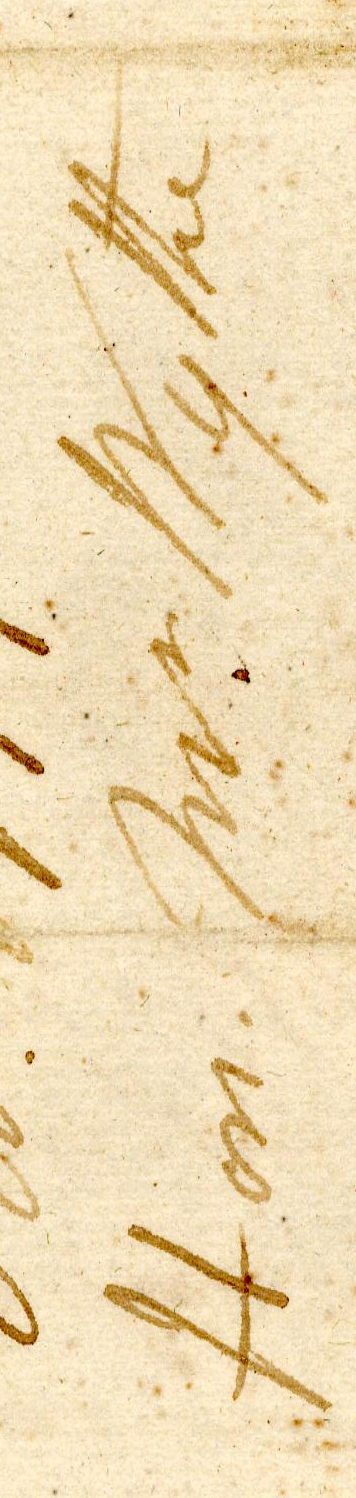Hon M^r Wythe
